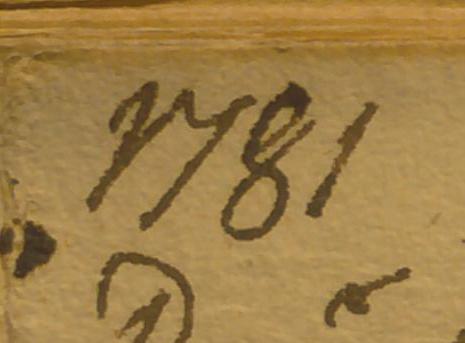1781
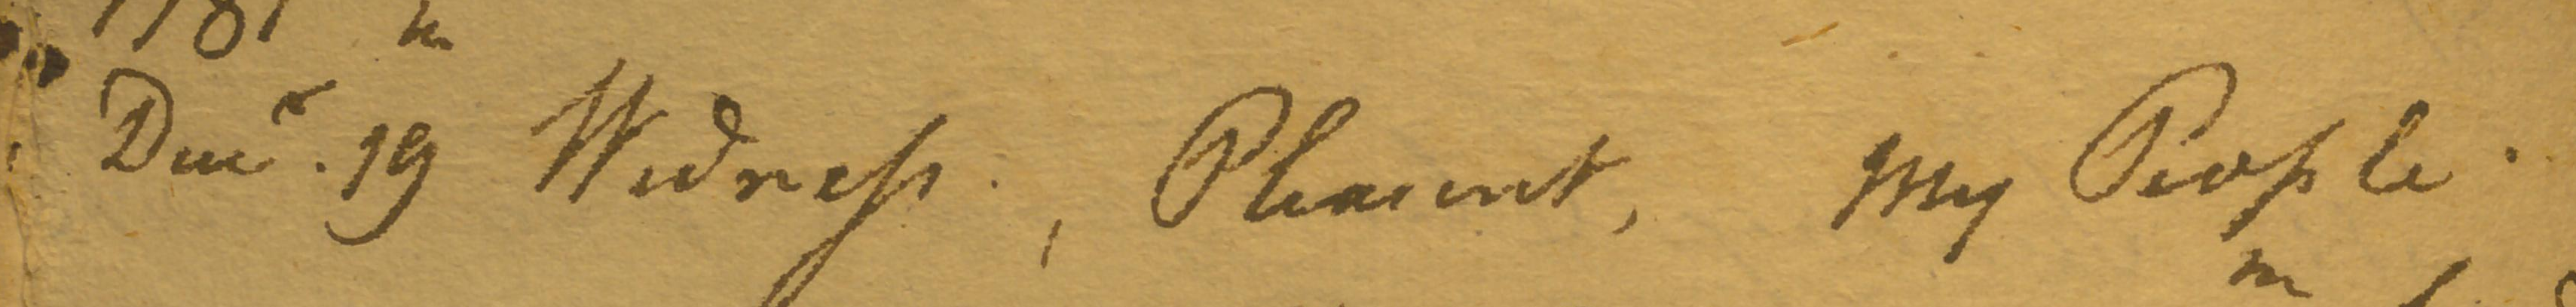Dec^r. 19 Wednes, Pleasent, My People
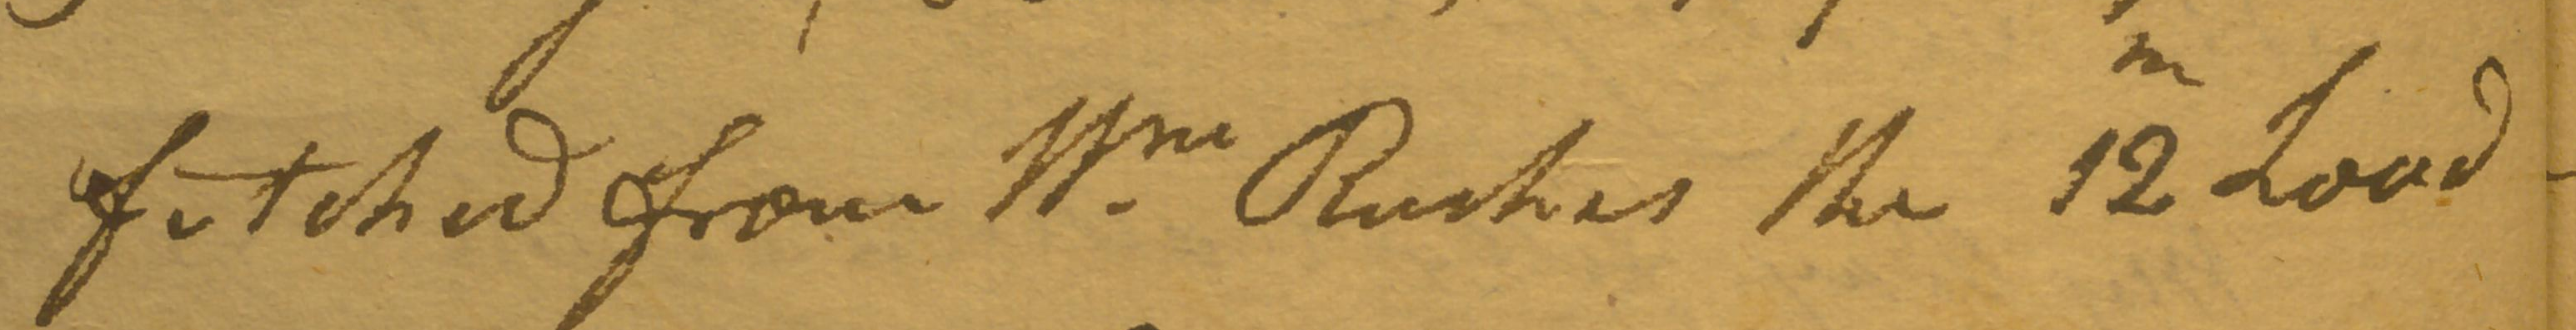fetched from W^m. Rushes the 12^th Load
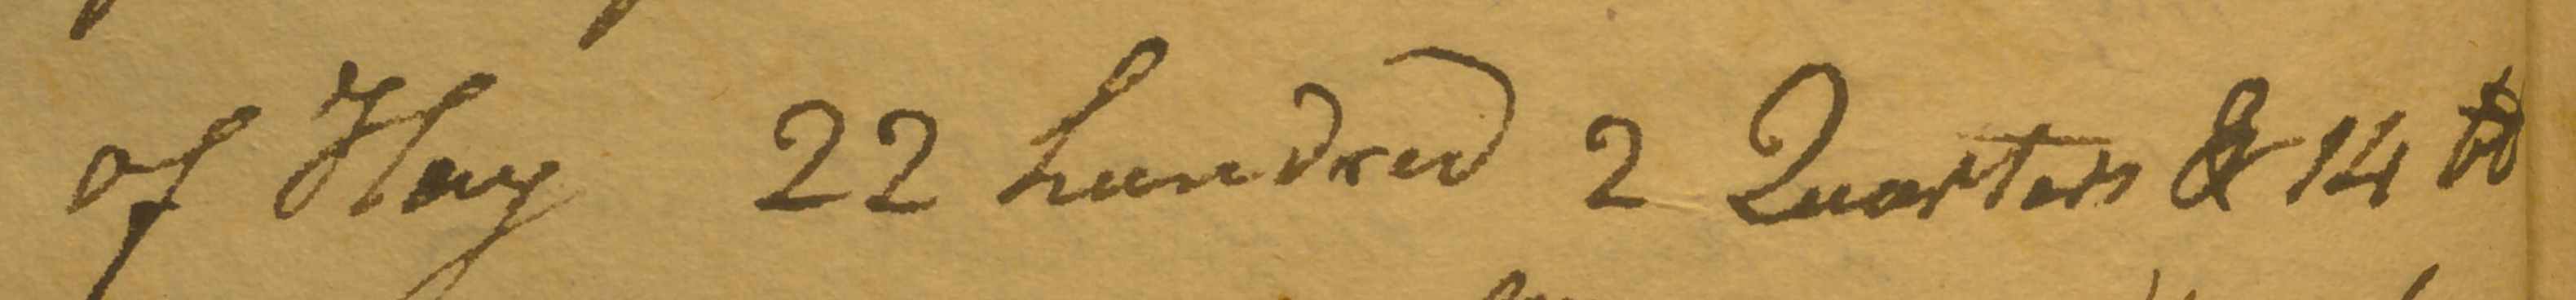of Hay 22 hundred 2 Quarters & 14 lb
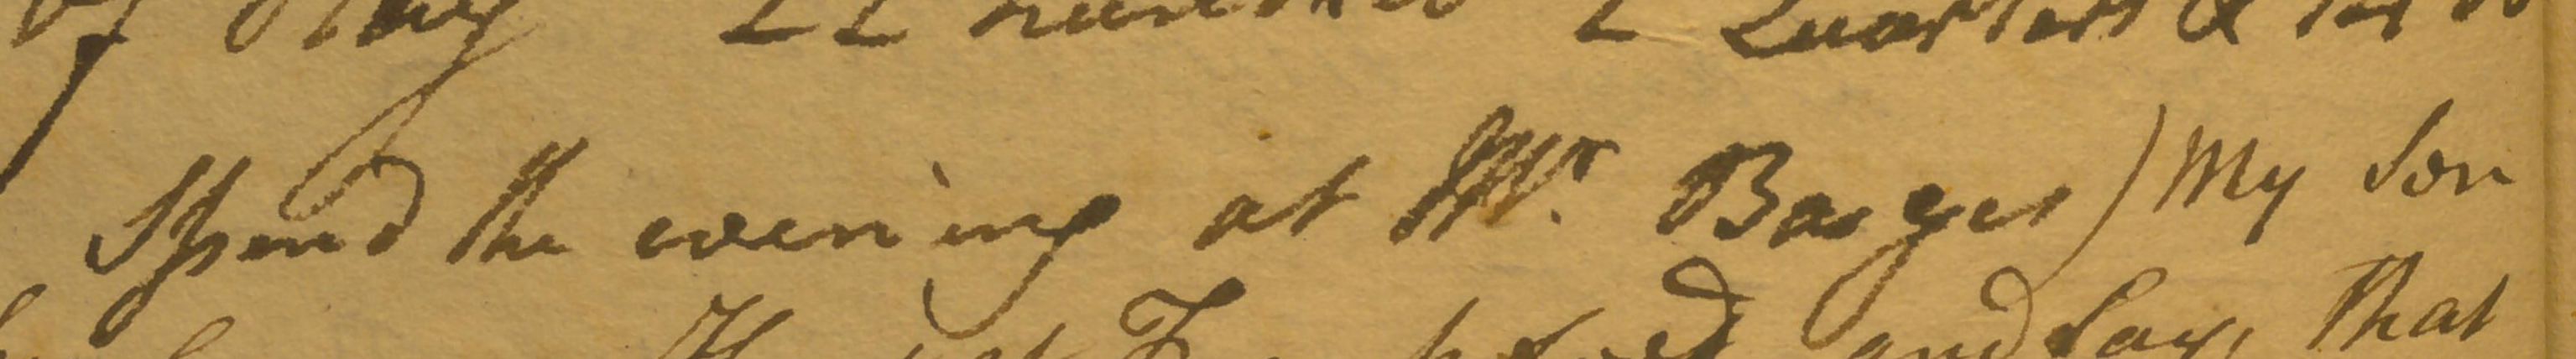spend the evening at M^r. Barges/ My Son
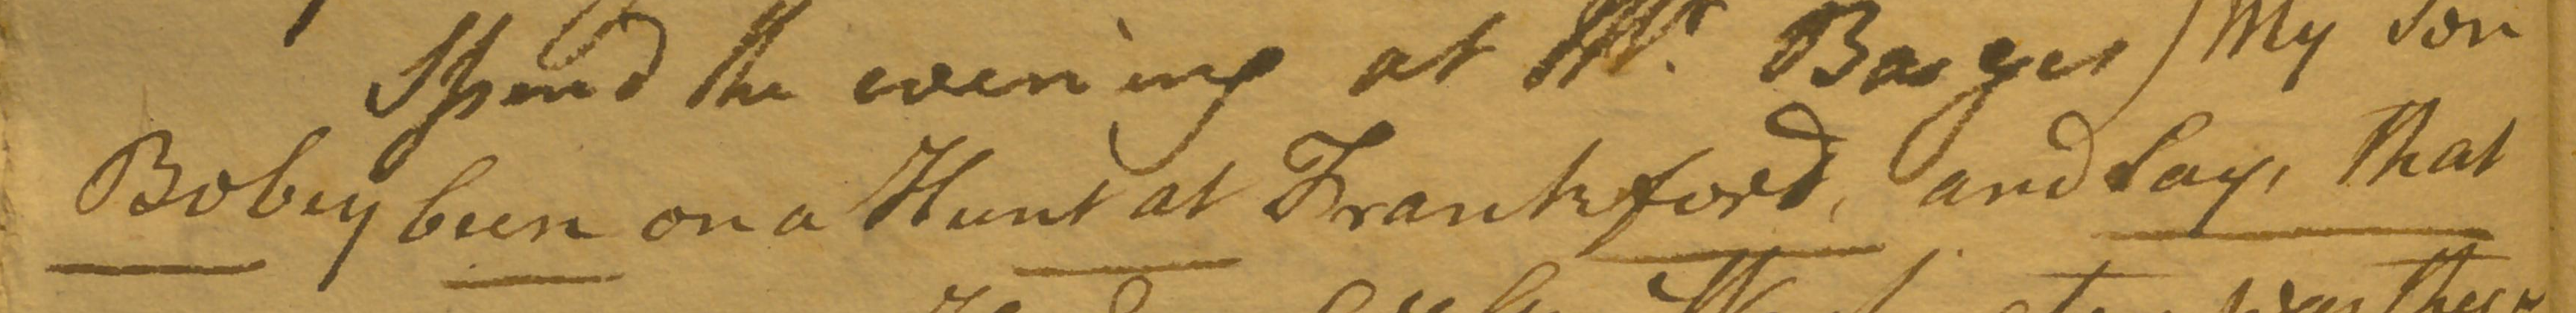Bobey been on a Hunt at Frankford. and says that
